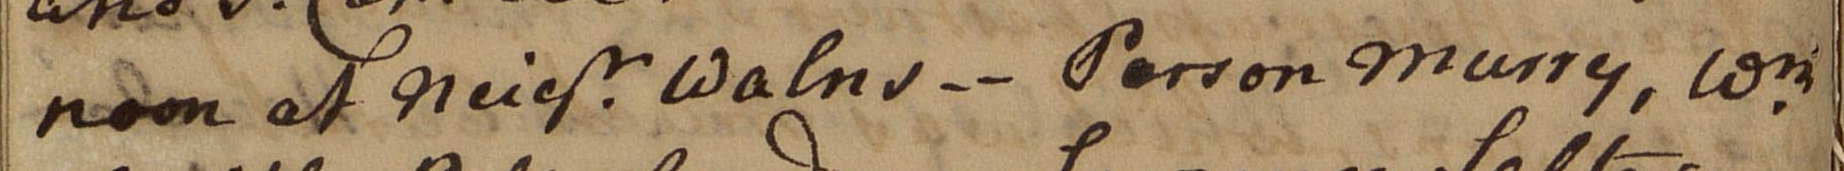noon at neig^t. Walns-- Parson Murry, W.^m
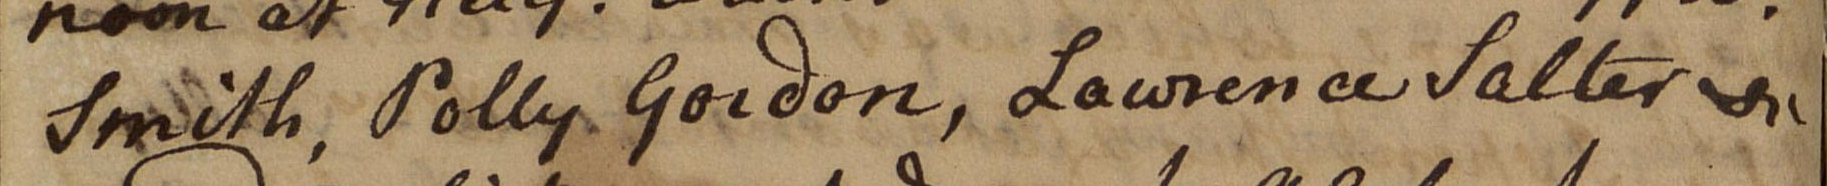Smith, Polly Gordon, Lawrence Salter &c
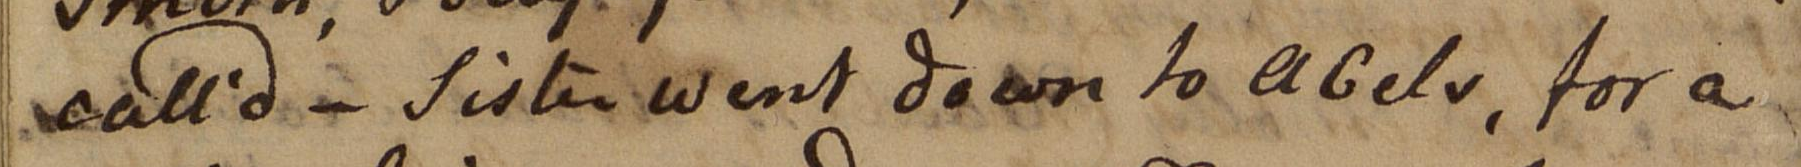call'd- Sister went down to Abels, for a
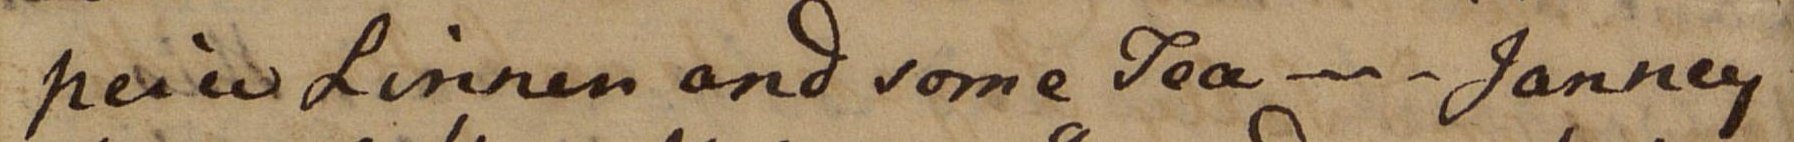peice Linnen and some Tea-- Janney
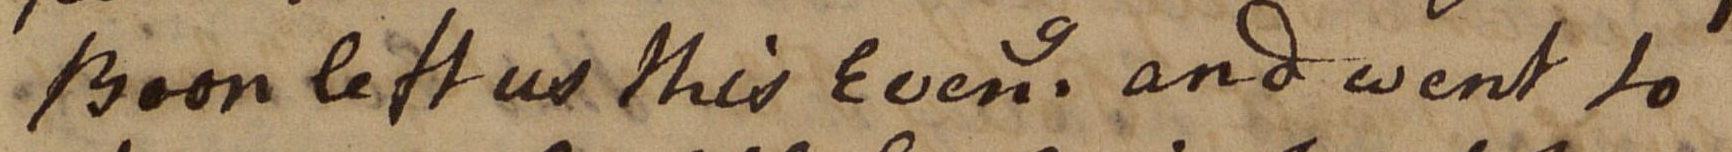Boon left us this Even^g and went to
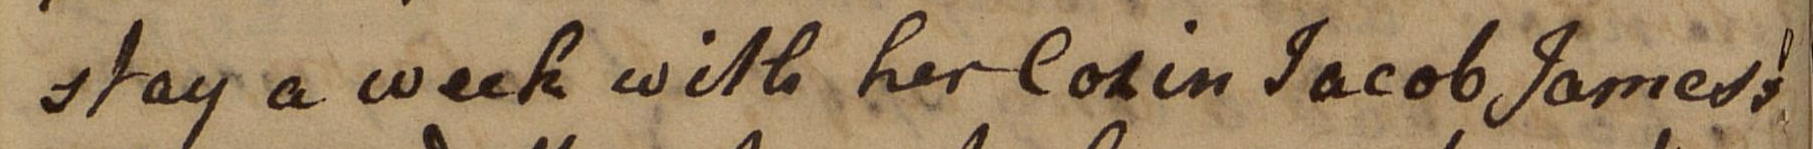stay a weeh with her Cozin Jacob, James's
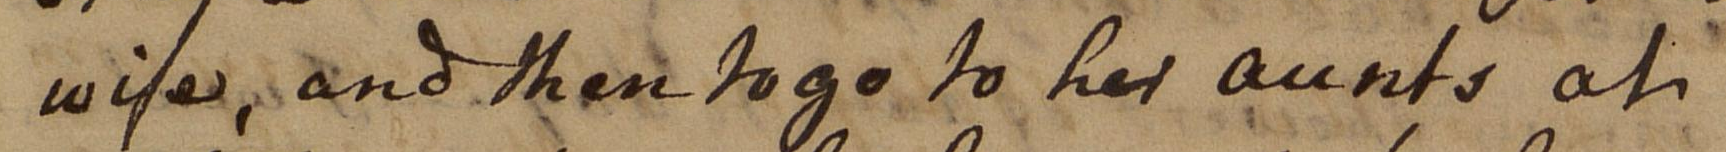wife, and then to go to her aunts at
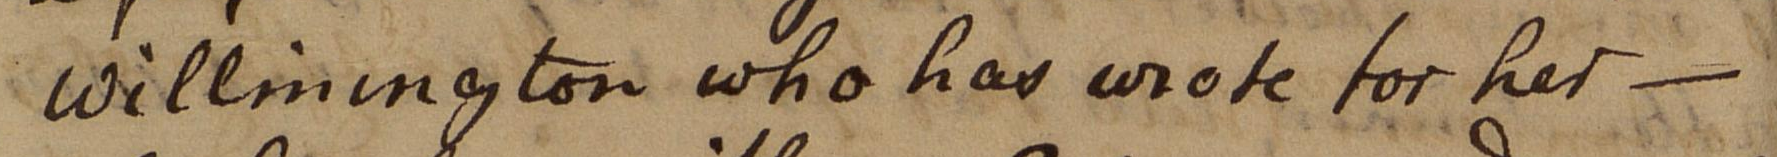Willmington who has wrote for her-
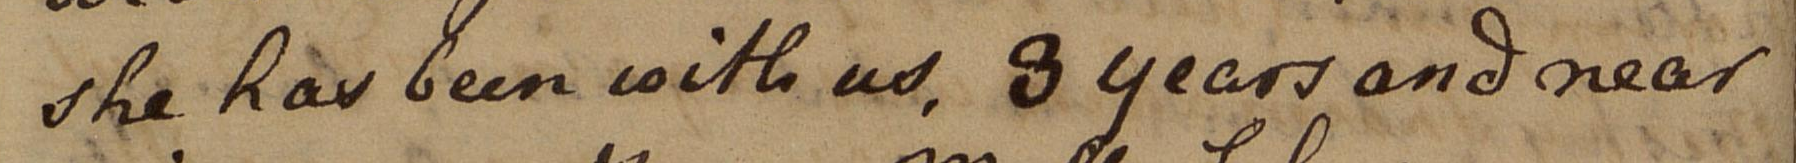she has been with us, 3 years and near
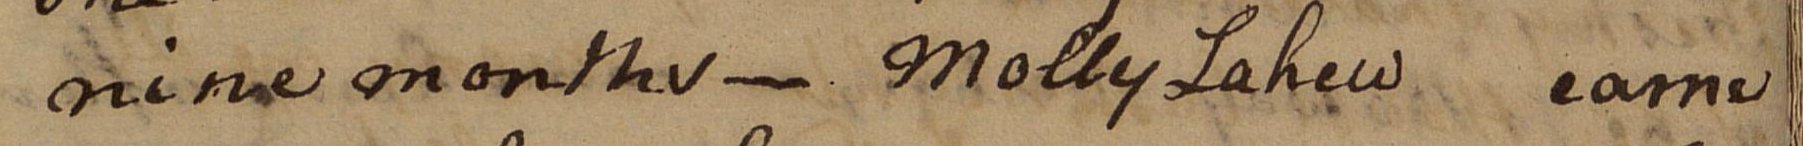nine months- Molly Lahew came
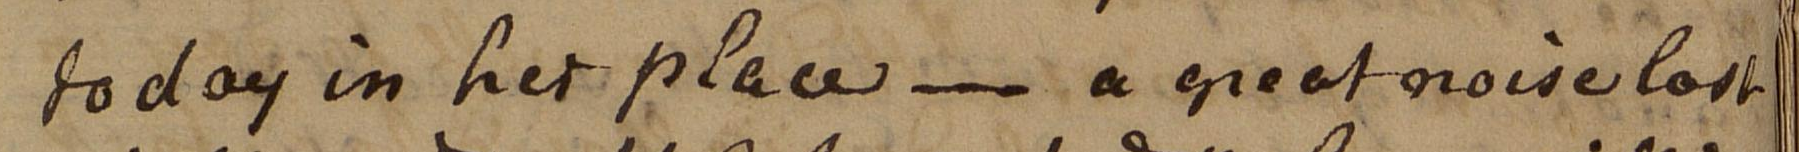to day in her place- a great noise last
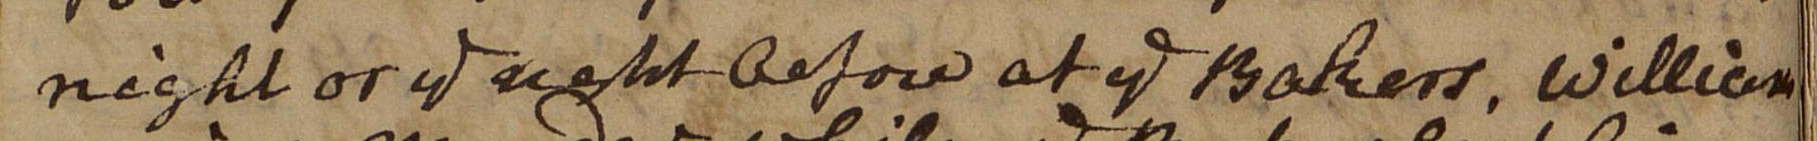night or y^e night before at y^e Bakers, William
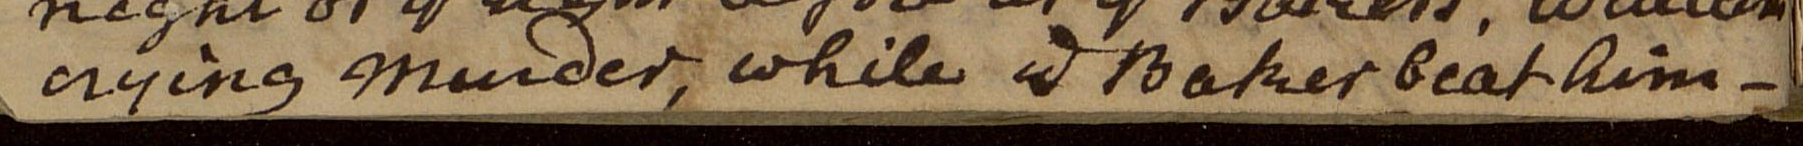crying murder, while y^e Baker beat him-
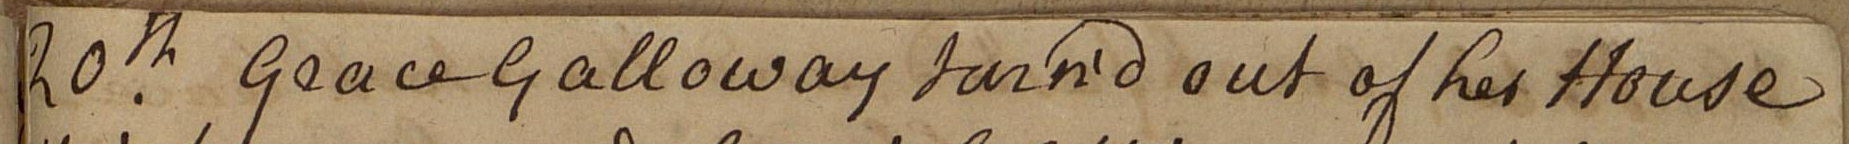20^th. Grace Galloway turn'd out of her House
